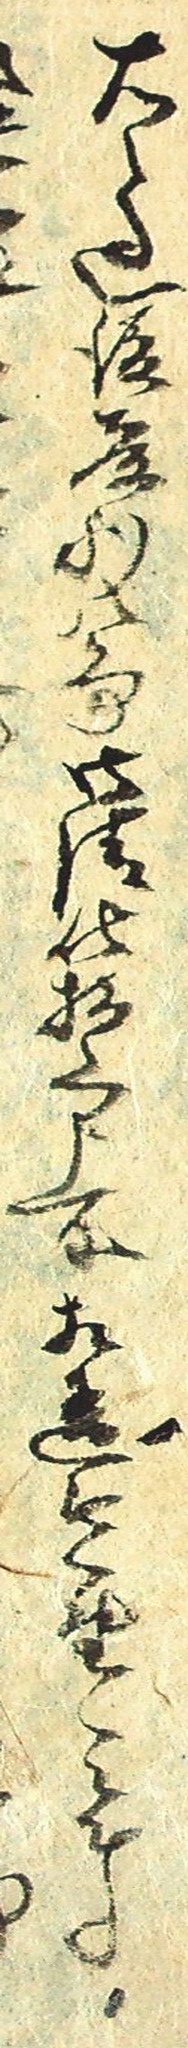右之通後藤利八郎御請仕指上申所相違無御座候に付

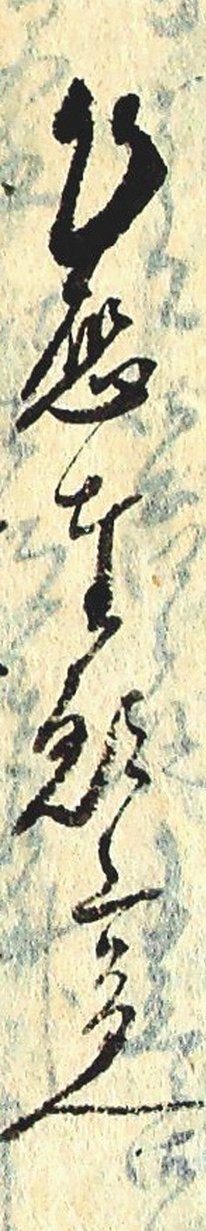乍恐奉願上覚
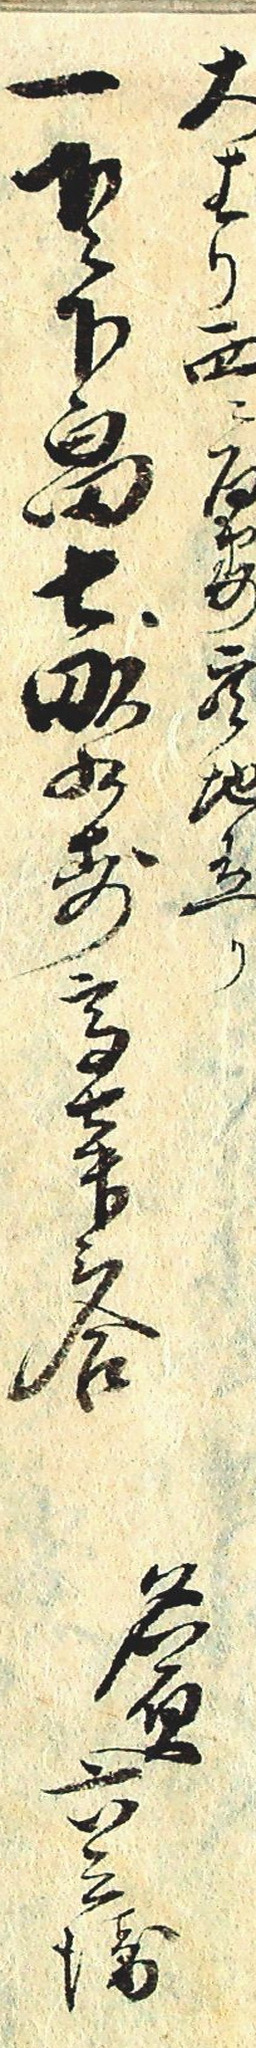一下々下畠七畝九歩高七升三合六兵衛
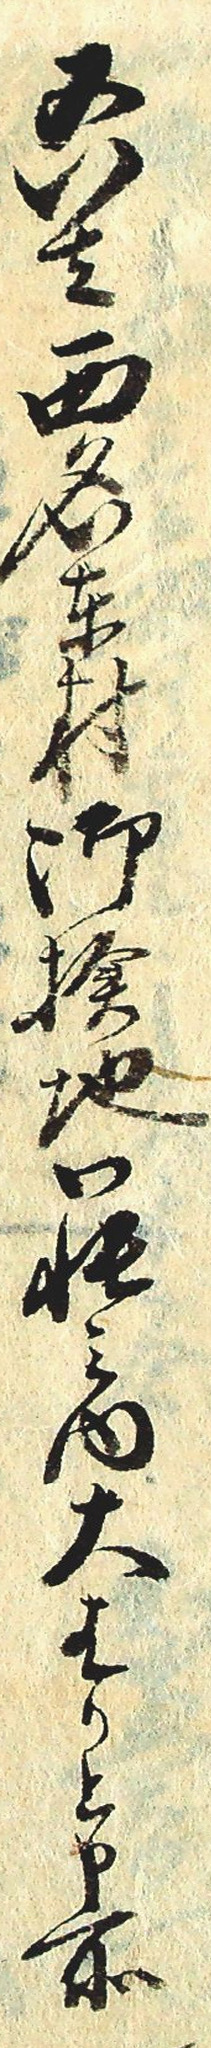右は西名東村御検地御帳之内大はりと申所
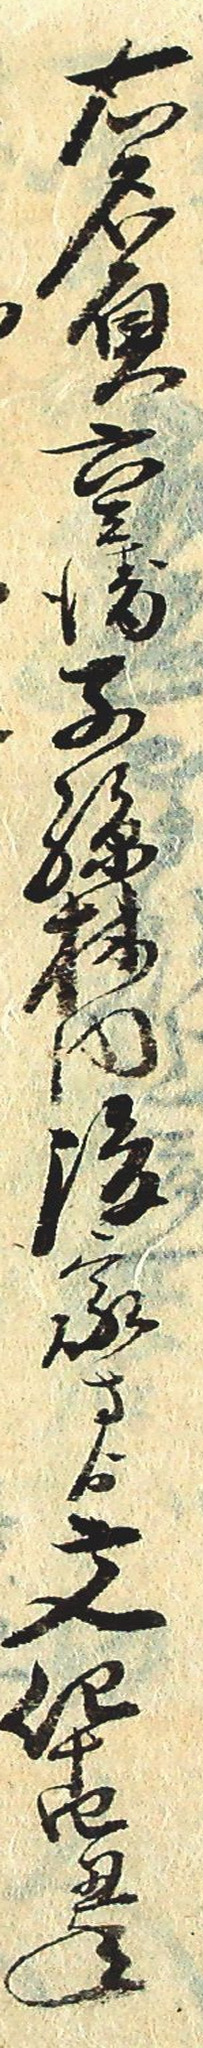右名負六兵衛子孫林内後家方ゟ文化十四丑年
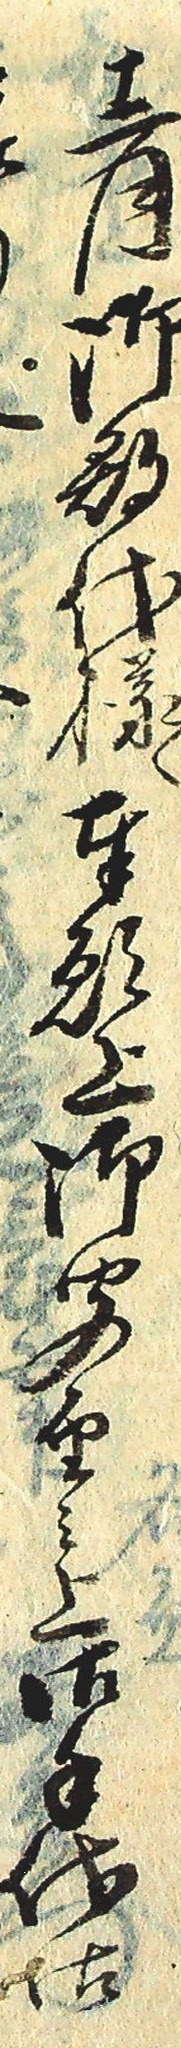十二月御郡代様へ奉願上御聞届之上御手代御
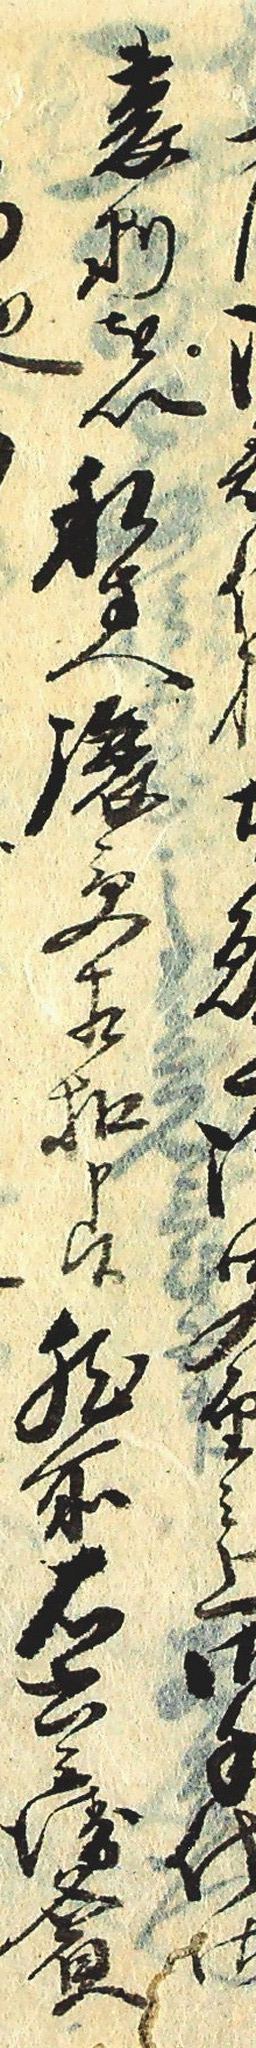裏判を以私方へ譲受相扣申候然所右六兵衛名負
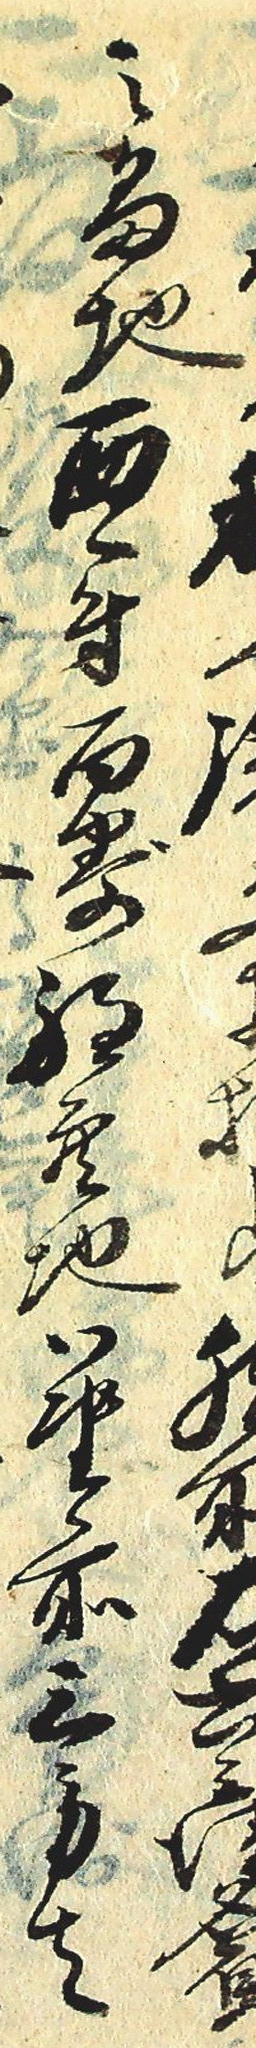之当地西へ付百歩程空地御座候所三方は
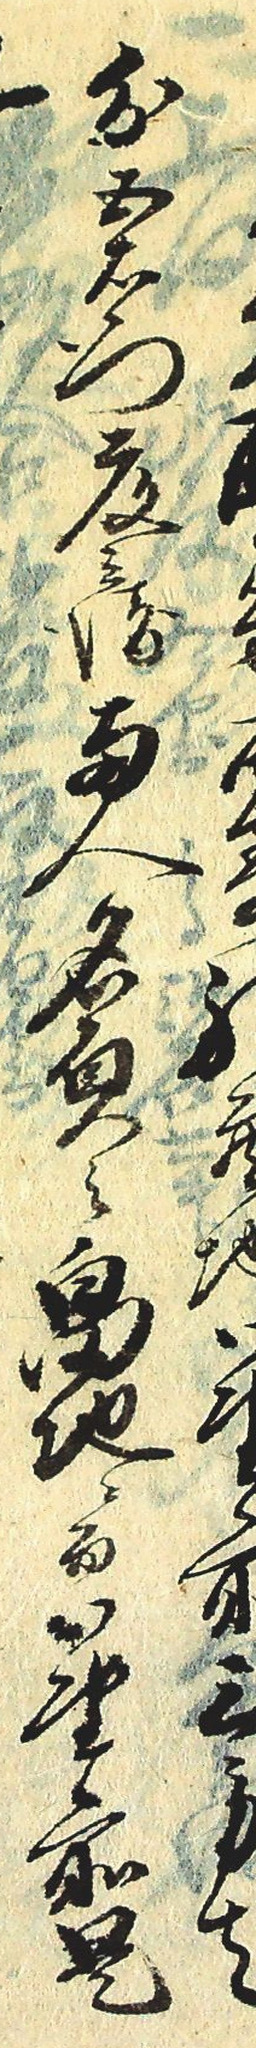分五右衛門藤兵衛両人名負之畠地にて御座候所是
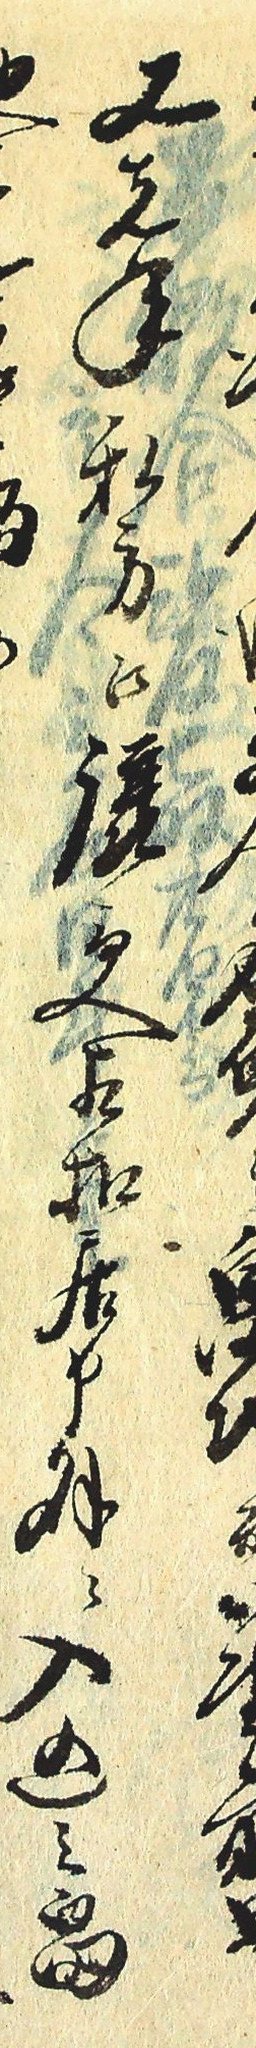又先年私方え譲受相扣居申外に入込之畠
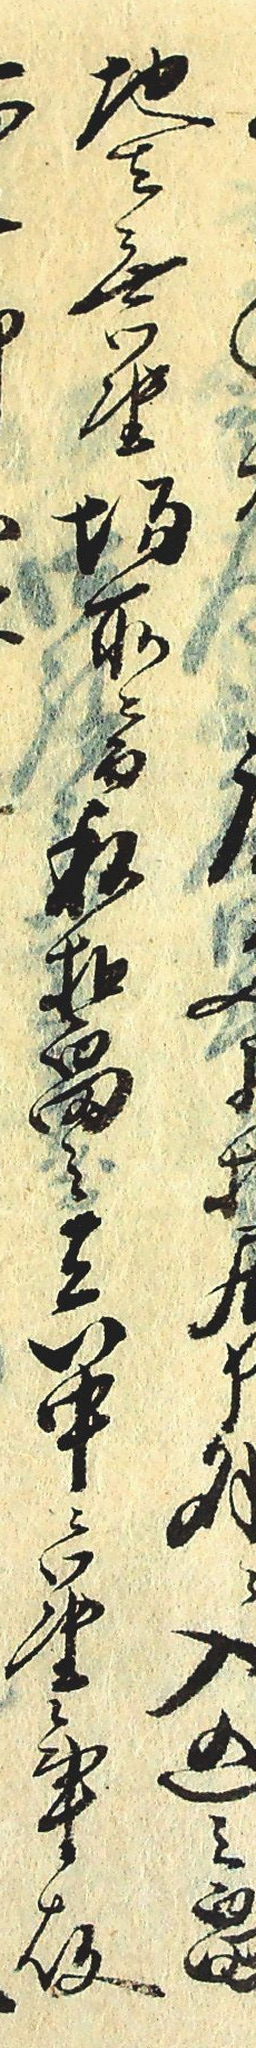地は無御座場所にて私扣畠之真中に御座候事故
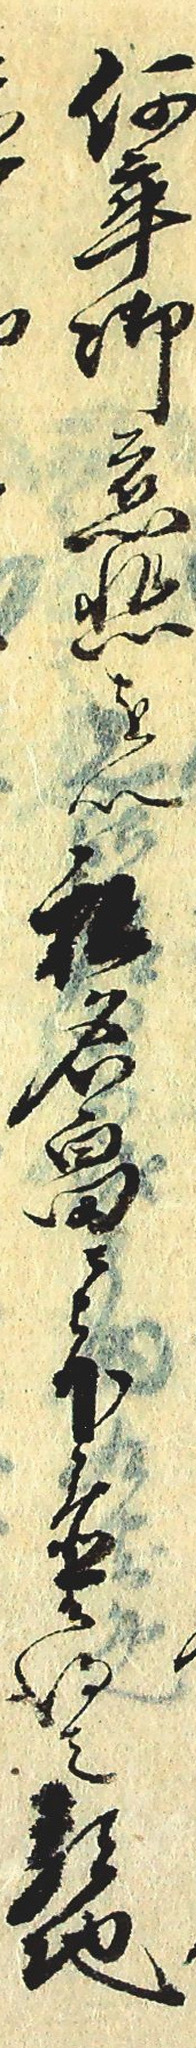何卒御慈悲を以私名畠に被下置候得は類地
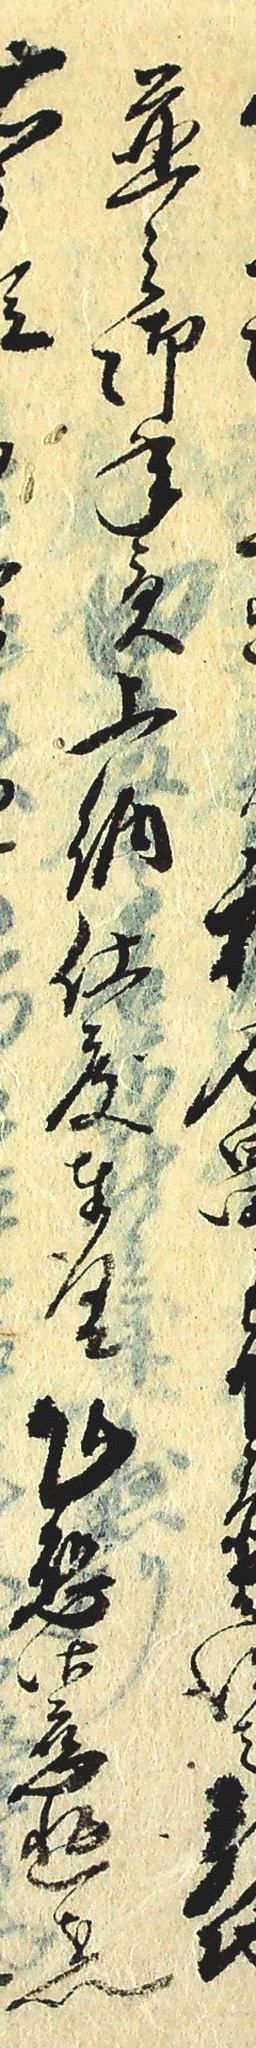並之御年貢上納仕度奉存候乍恐御慈悲を以
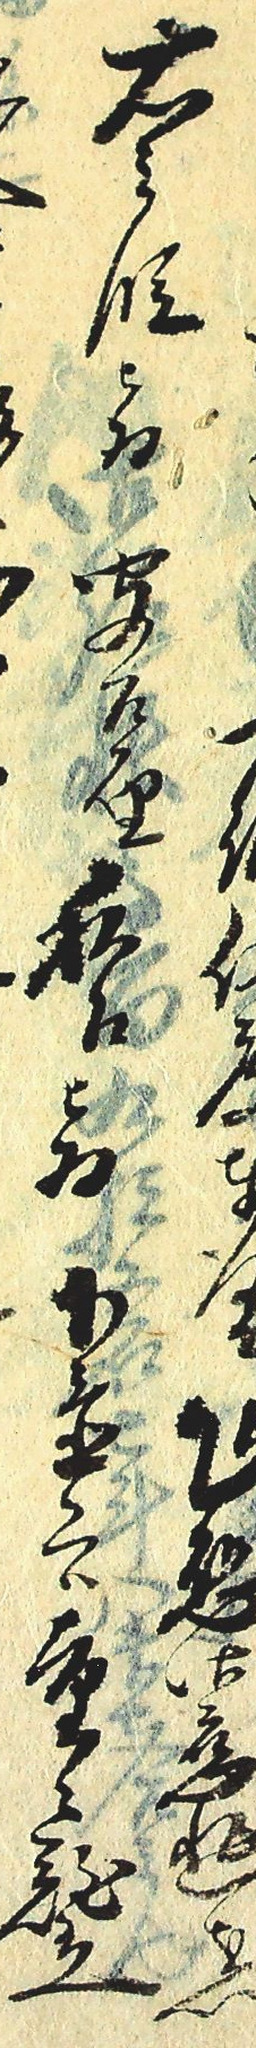右之段被為聞召届私え被為下置候はゝ重々難有
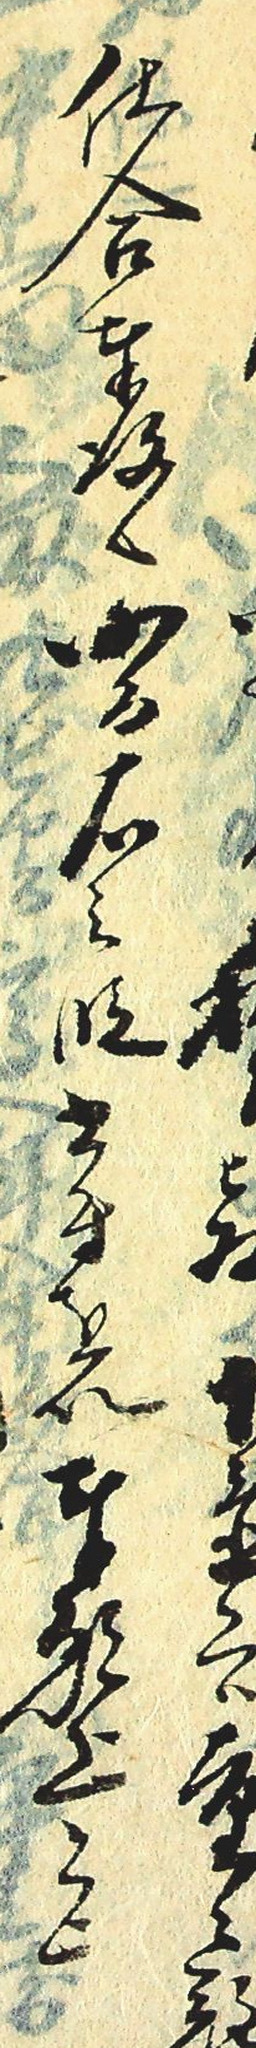仕合奉存候仍て右之段書付を以奉願上候以上
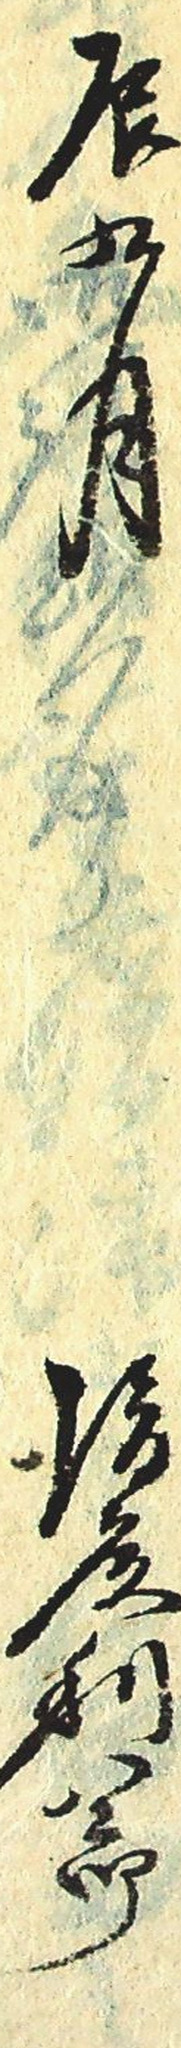辰九月後藤利八郎
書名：諸御願書控(弐番）
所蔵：鳴門教育大学 Naruto University of Education
